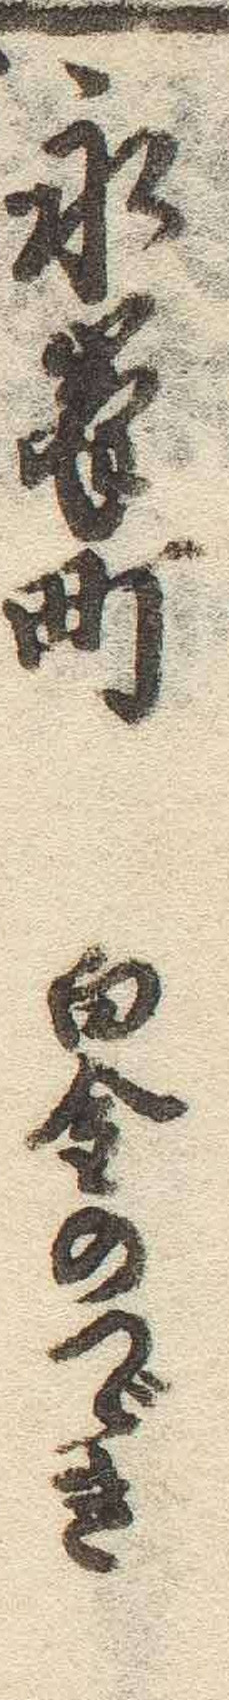永峯町白金のつゞき
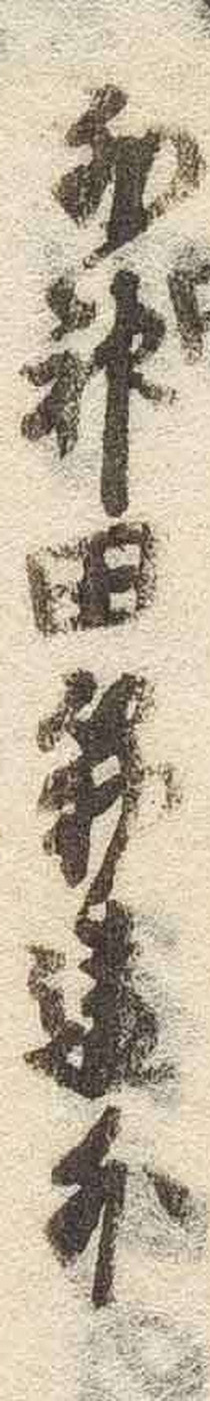外神田筋違外
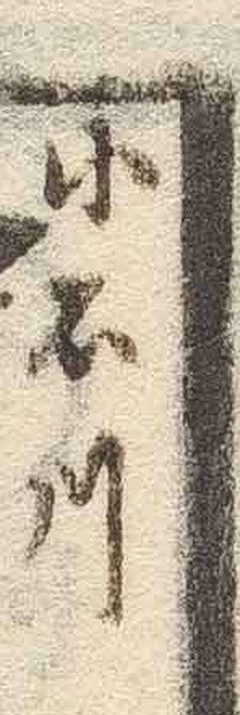小石川
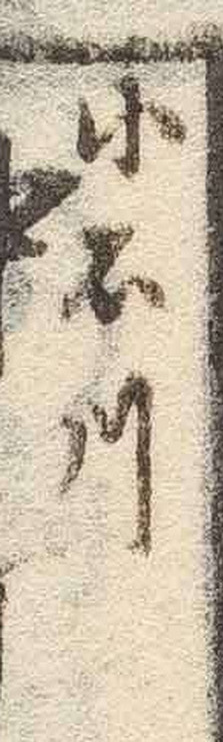小石川
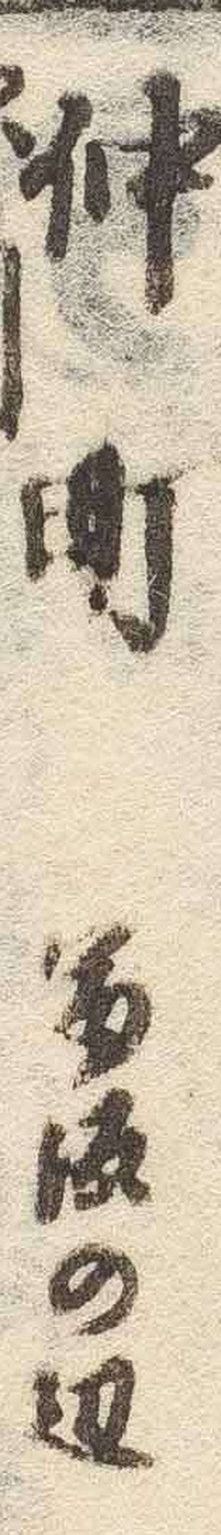仲町富坂の辺
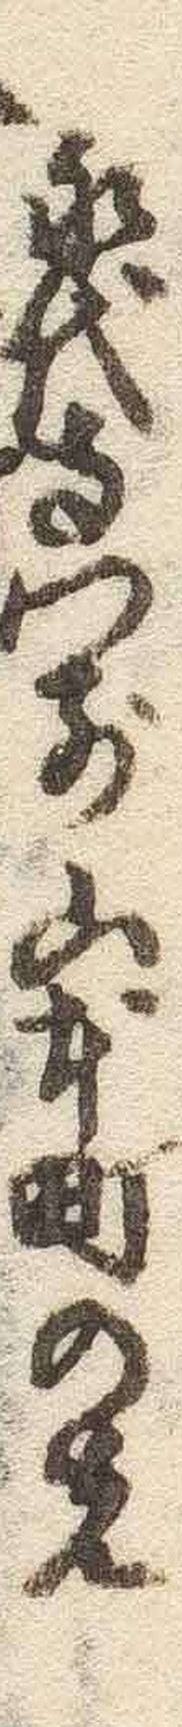永代寺門前山本町の先
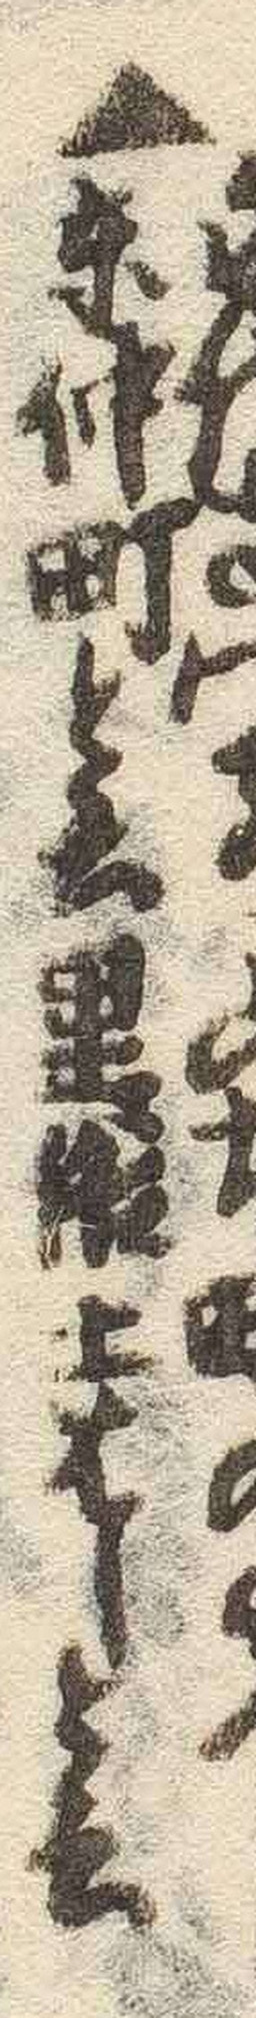▲東仲町と云里俗土はしと云
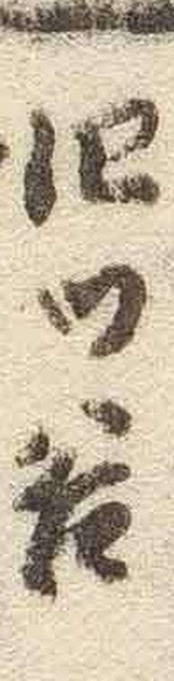四ッ谷
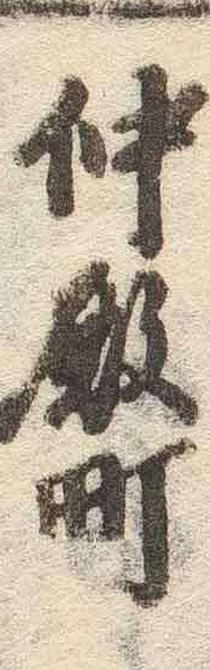仲殿町
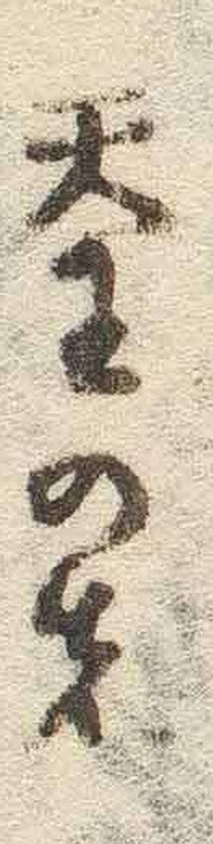天王の先
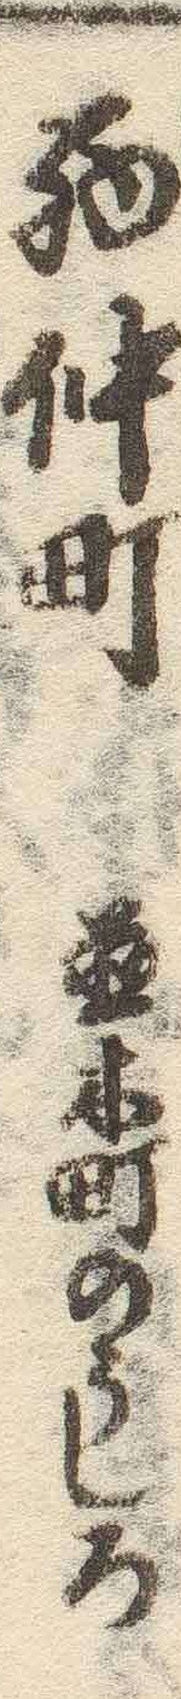西仲町並木町のうしろ
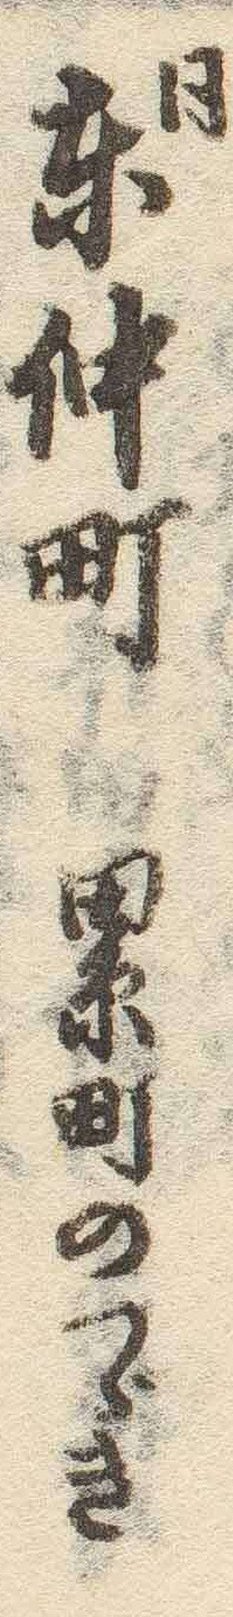東仲町田原町のつゞき
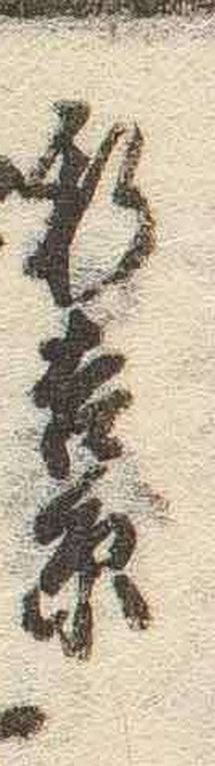新吉原
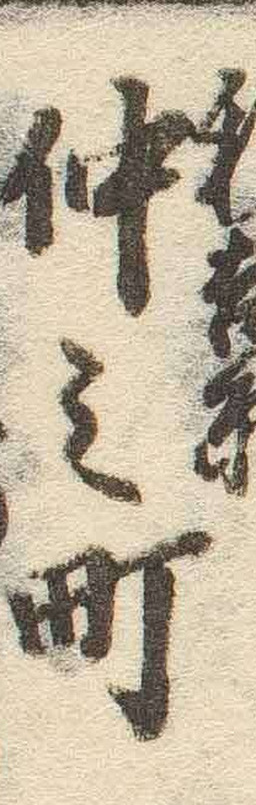仲之町
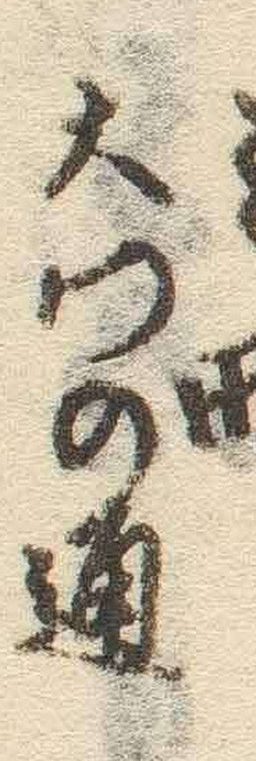大門の通
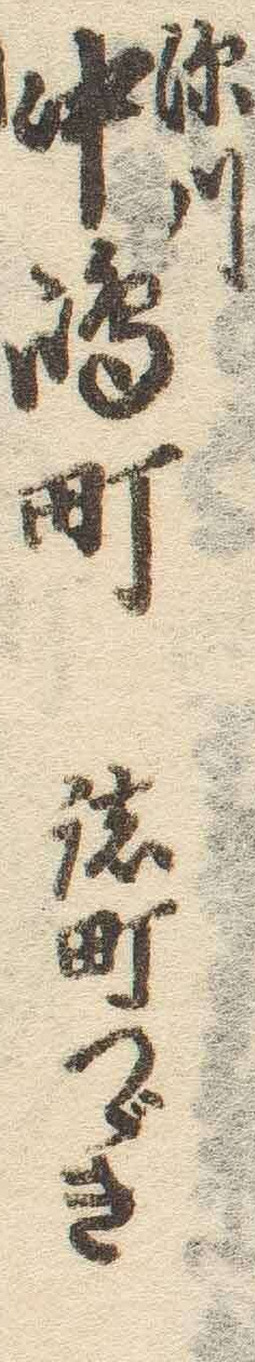中島町諸町つゞき
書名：江戸町独案内
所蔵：東京学芸大学附属図書館 国文学研究資料館
